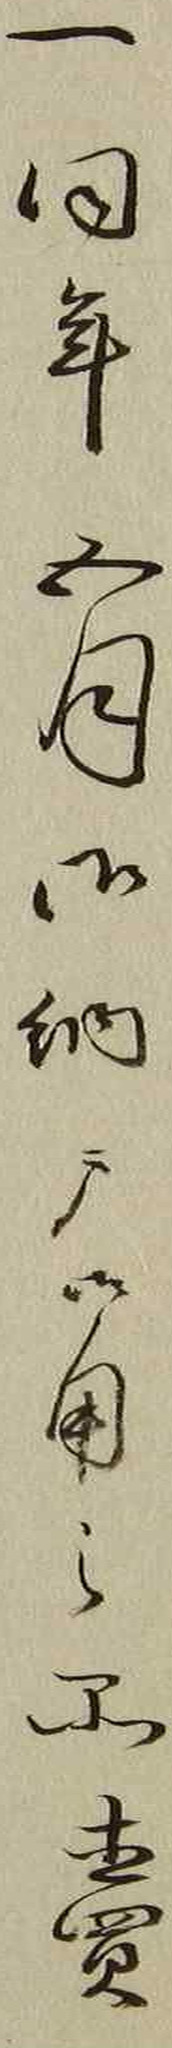一同年五月御納戸御用之品直買
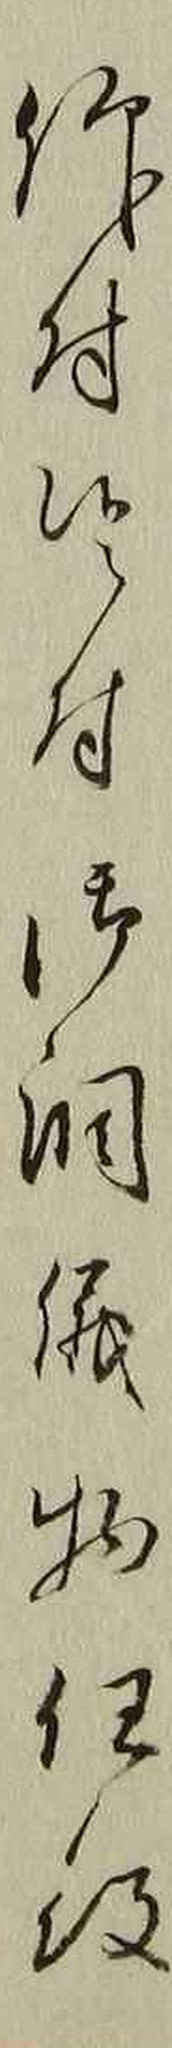被仰付候ニ付御調儀物任役
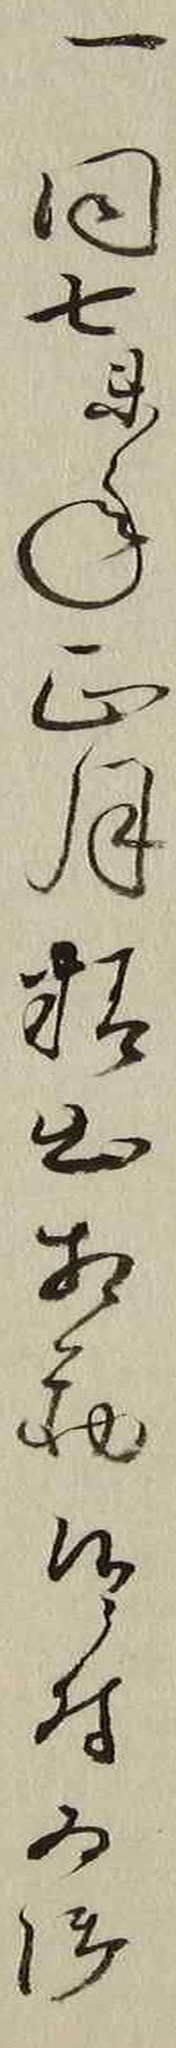一同七未年正月精出相勤候ニ付為御
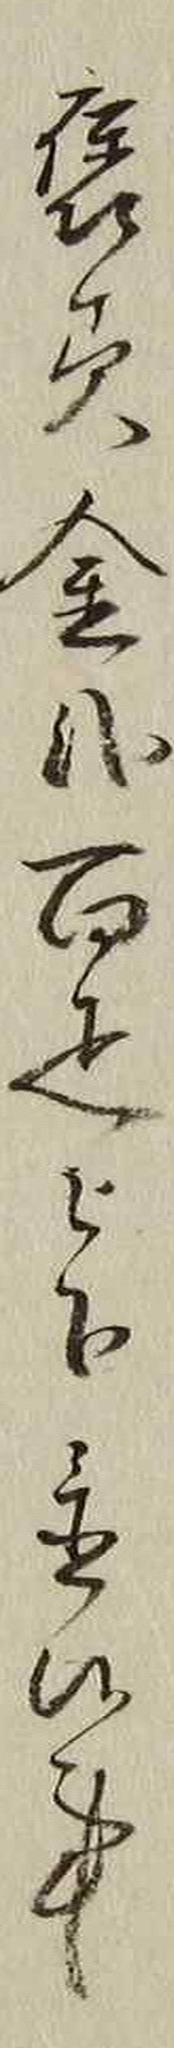褒美金弐百疋被下置候事
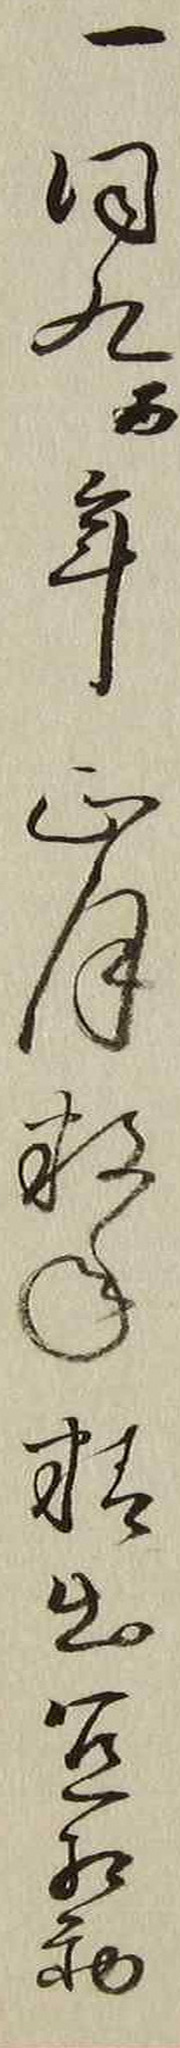一同九酉年正月数年精出宜相勤
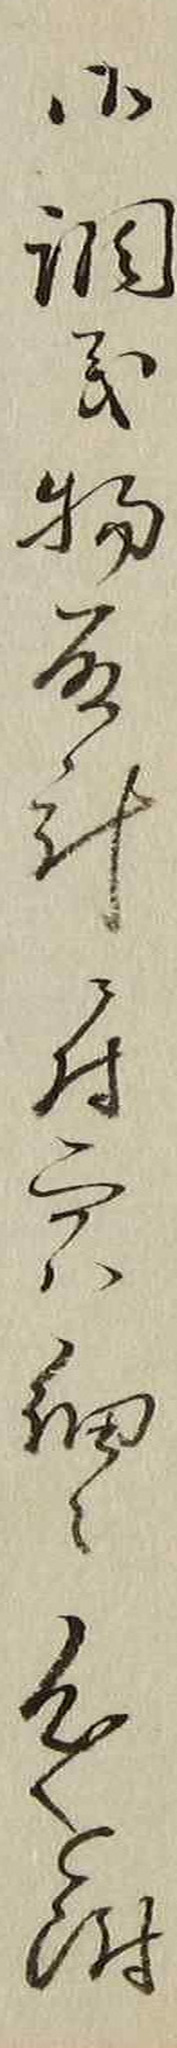御調義物取計ニ付而ハ細々心を附
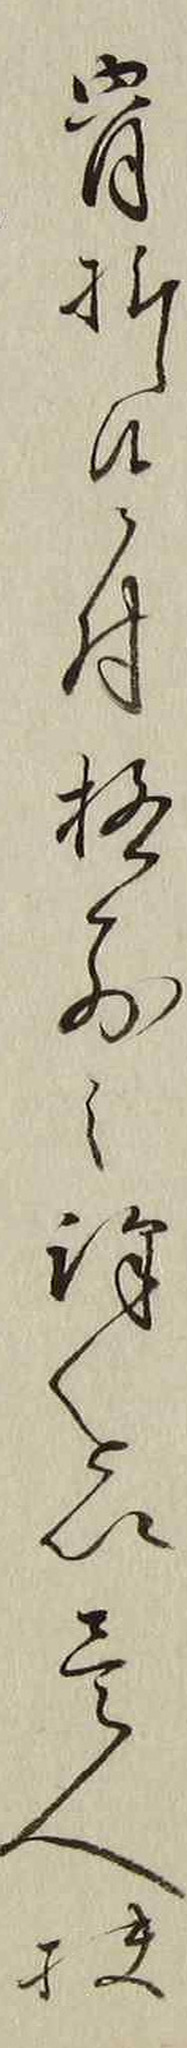骨折候ニ付格別之訳を以壱人扶
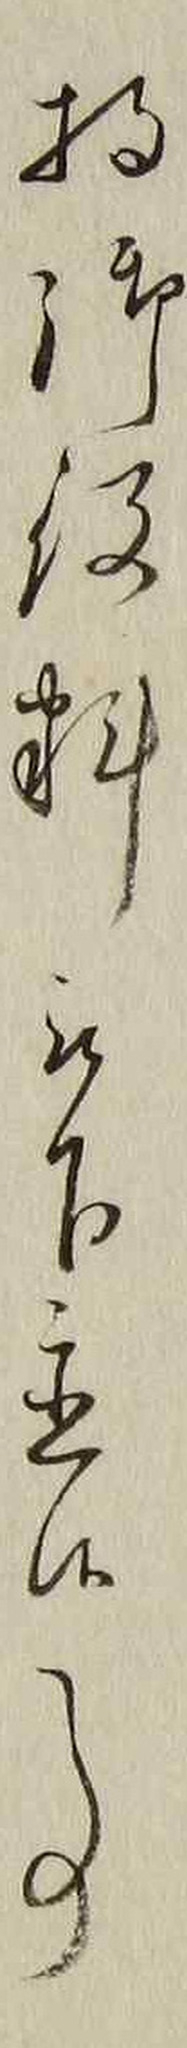持御役料被下置候事
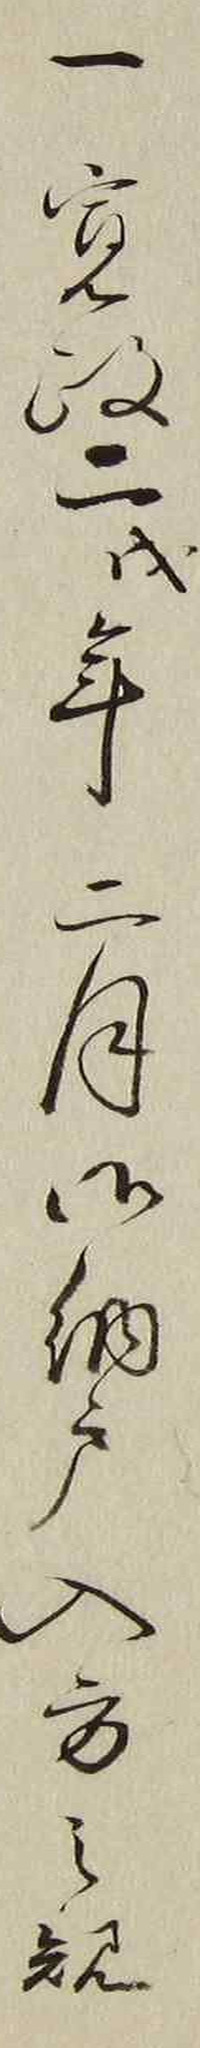一寛政二戌年二月御納戸入方之規
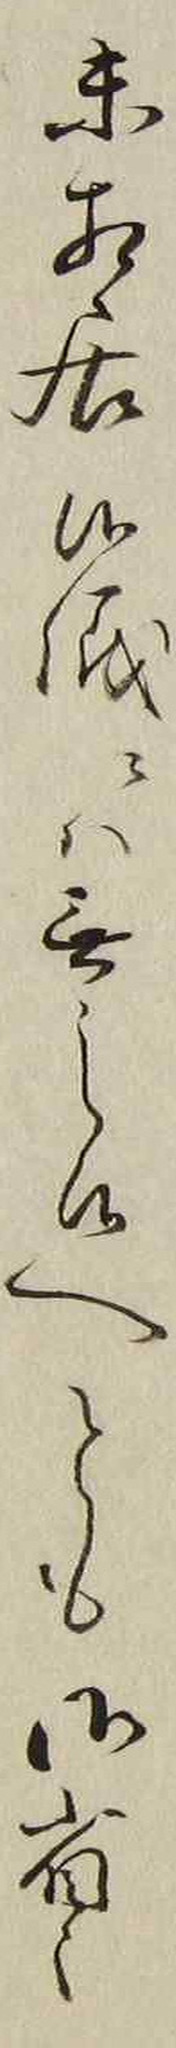未相居候儀ニハ無之候へとも御省之
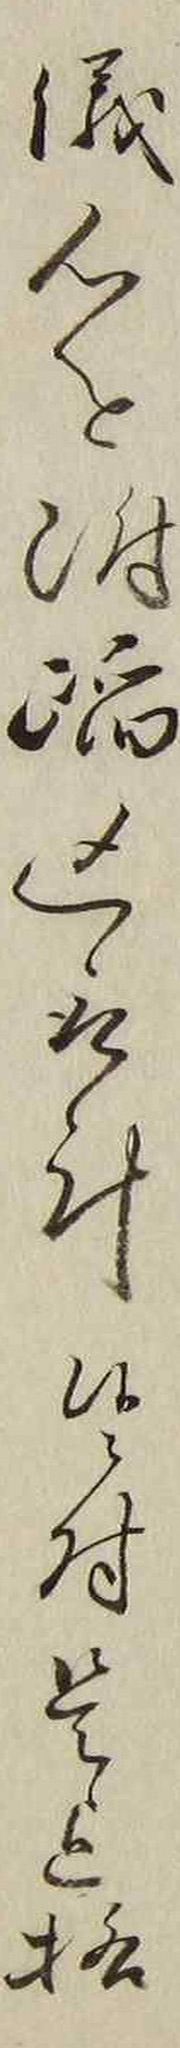儀心を附踏込取計候ニ付是迄格

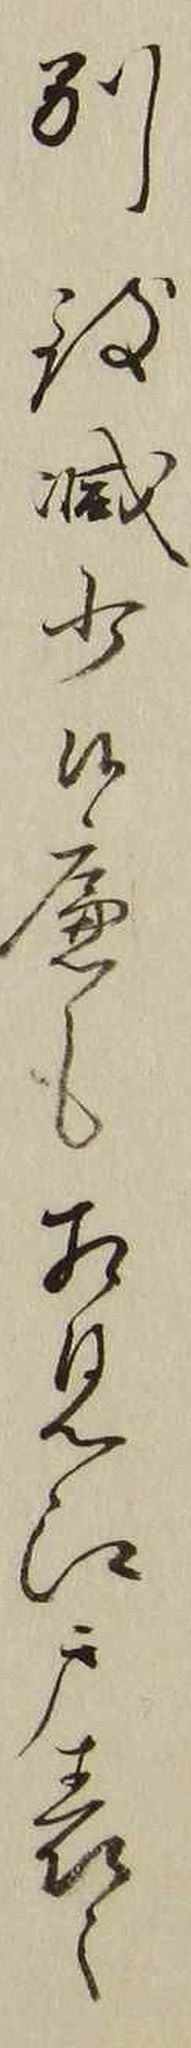別致減少候廉も相見江戸表之
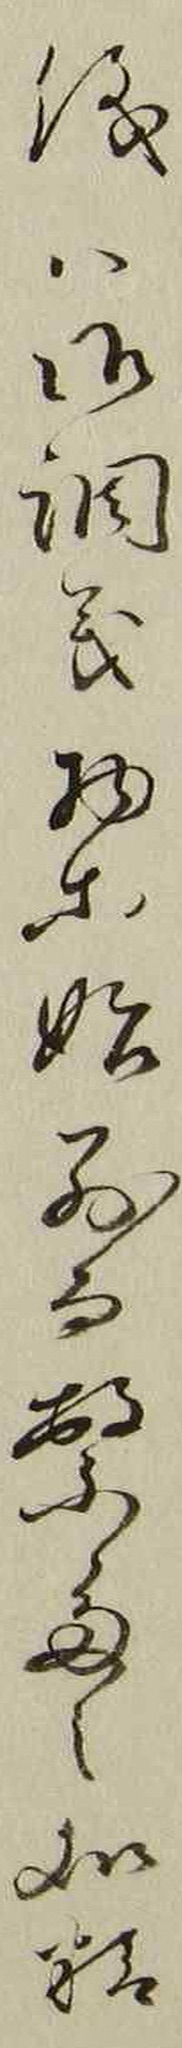儀ハ御調義物等始別而繁多之処精
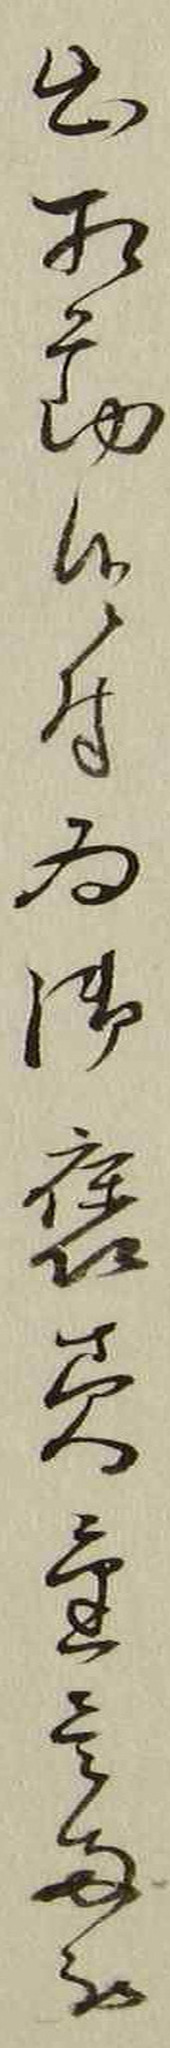出相勤候ニ付為御褒美金壱両被
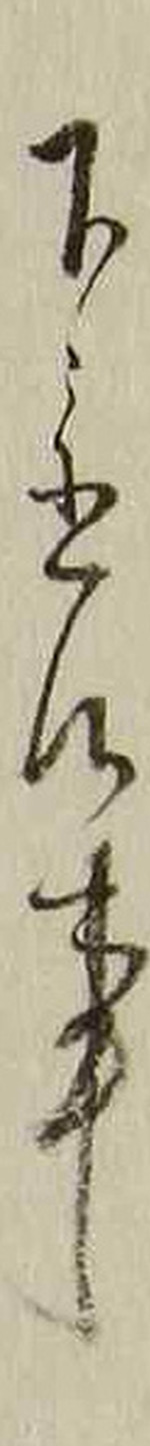下置候事
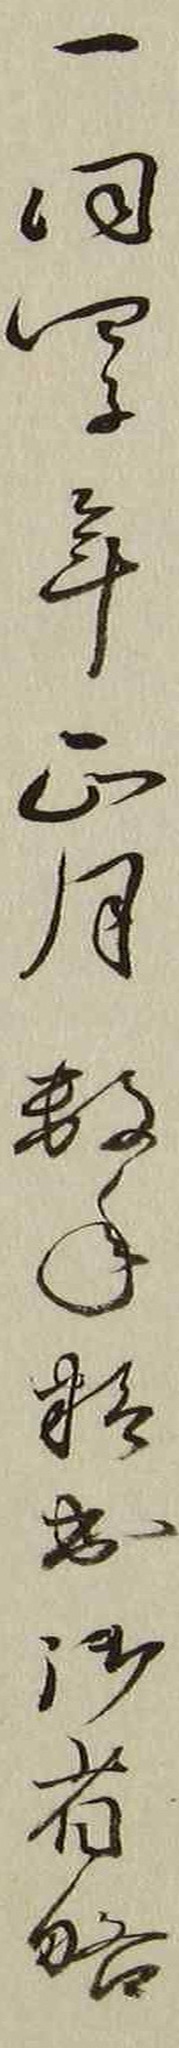一同四子年正月数年精出御省略
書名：諸士系譜　巻之4　い之部4
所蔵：会津若松市立会津図書館
